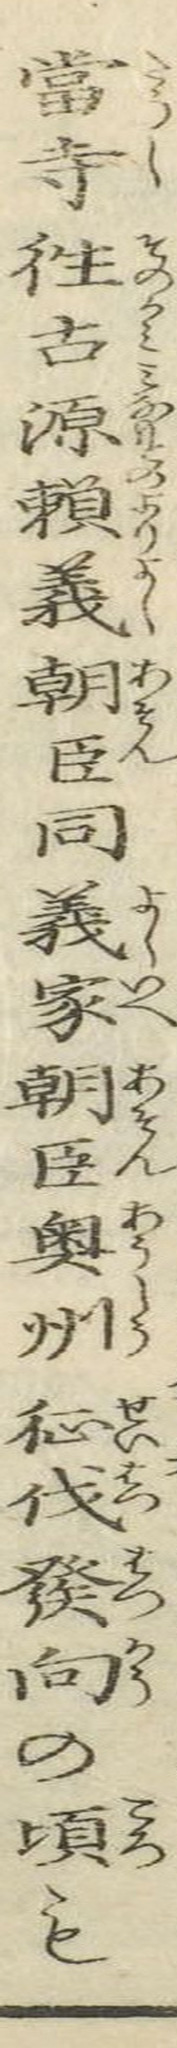当寺往古源頼義朝臣同義家朝臣奥州征伐発向の頃も
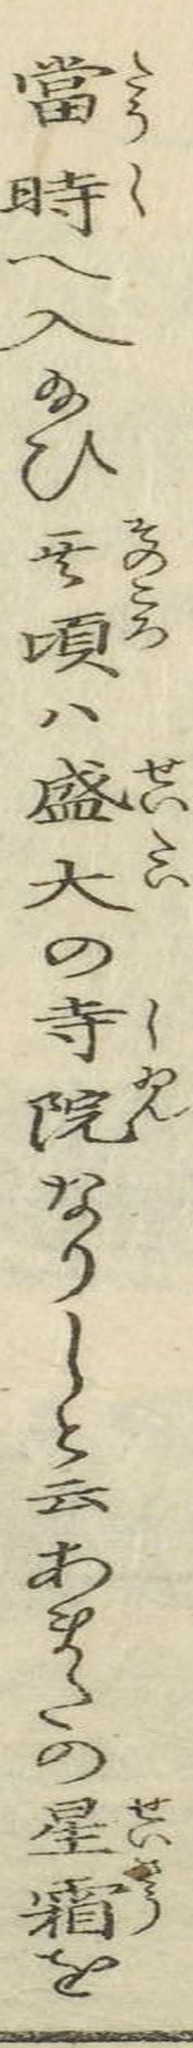当時へ入給ひ其頃は盛大の寺院なりしと云あまたの星霜を
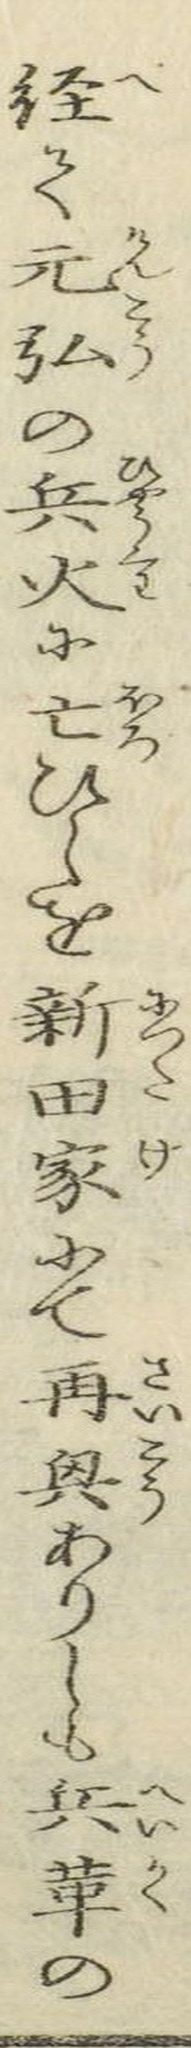経て元弘の兵火に亡ひしを新田家にて再興ありしも兵革の
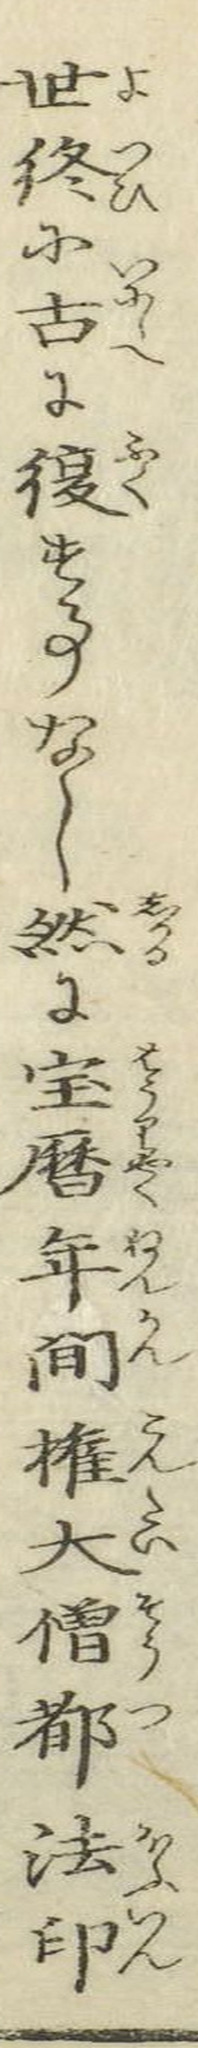世終に古に復す事なし然に宝暦年間権大僧都法印
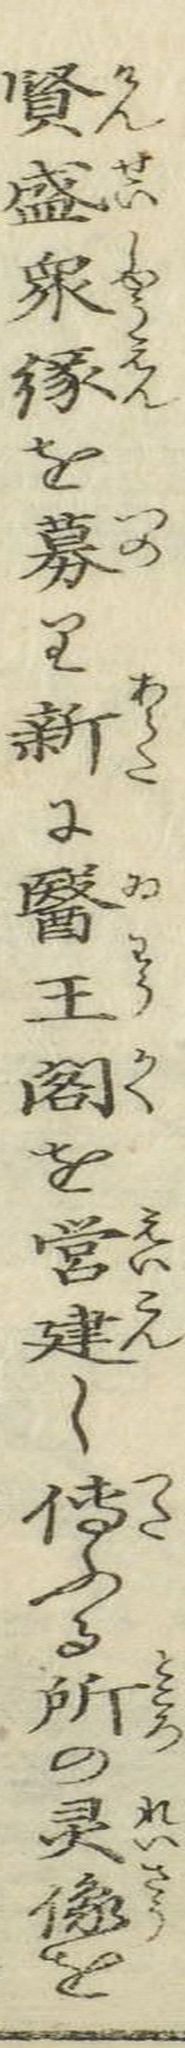賢盛衆縁を募り新に医王閣を営建し傳ふる所の灵像を
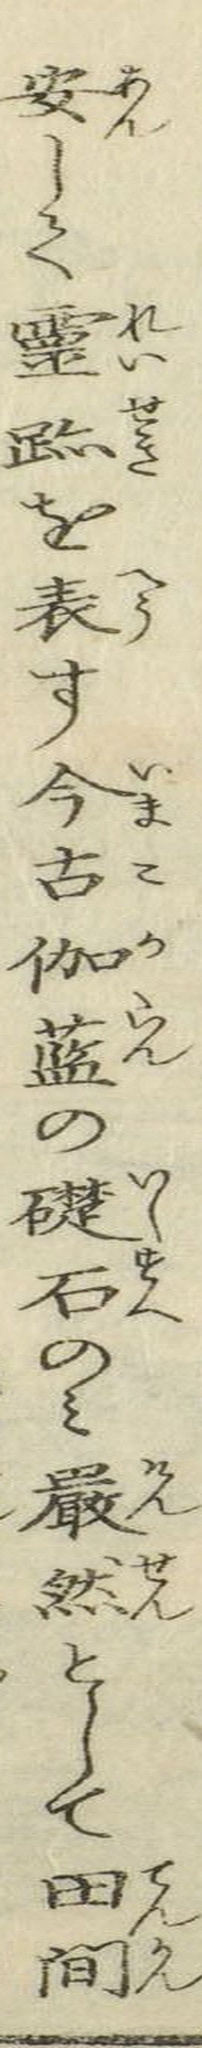安して霊跡を表す今古伽藍の礎石のみ厳然として田間
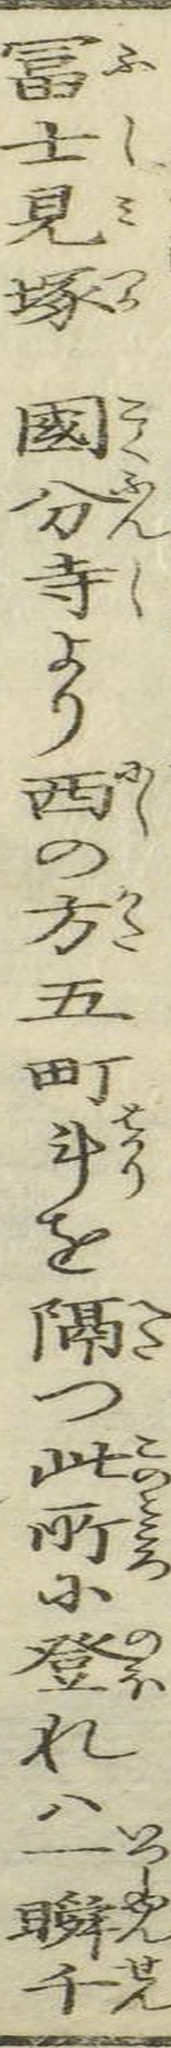富士見塚国分寺より西の方五町斗を隔つ此所に登れは一瞬千
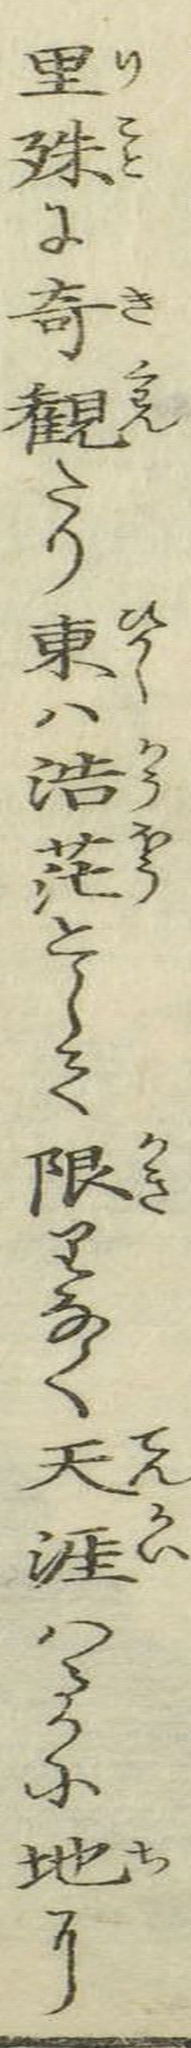里殊に奇観たり東は浩茫として限りなく天涯はるかに地に
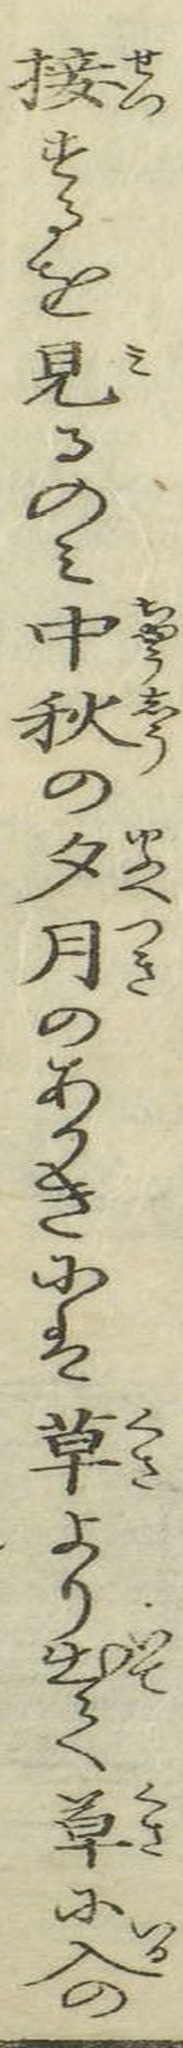接するを見るのみ中秋の夕月のあかきには草より出て草に入の
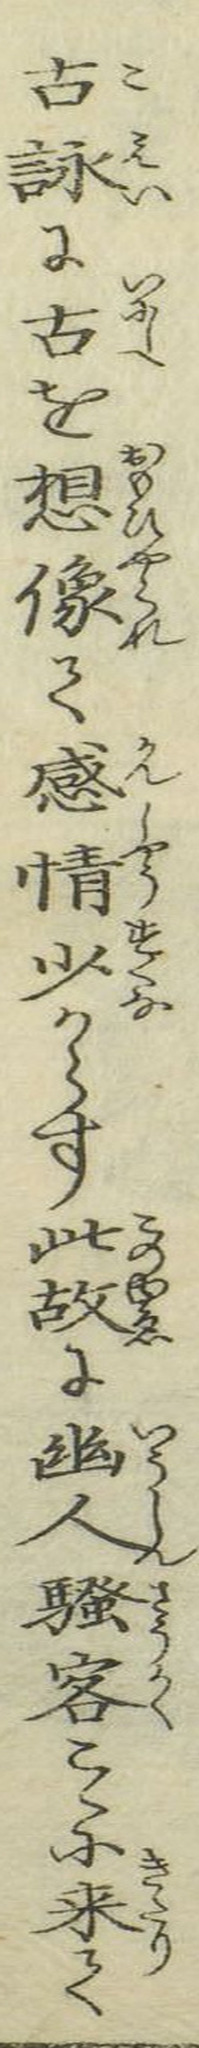古詠に古を想像て感情少からす此故に幽人騒客こゝに来て

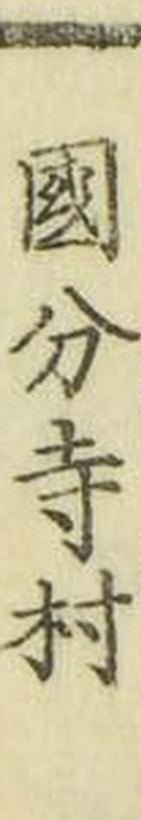国分寺村
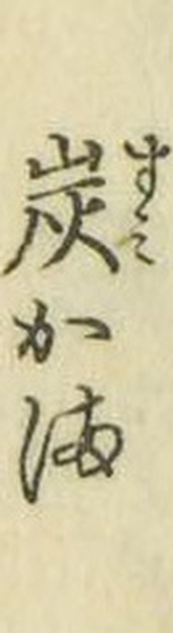炭かま
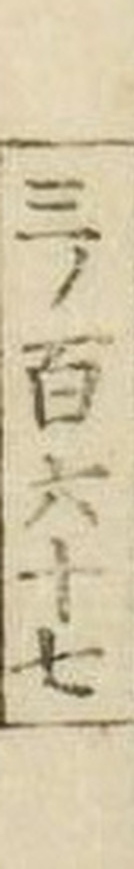三ノ百六十七

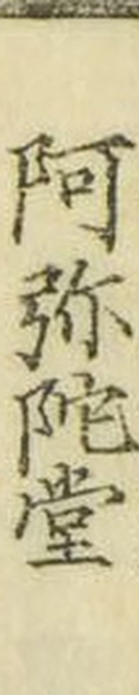阿弥陀堂
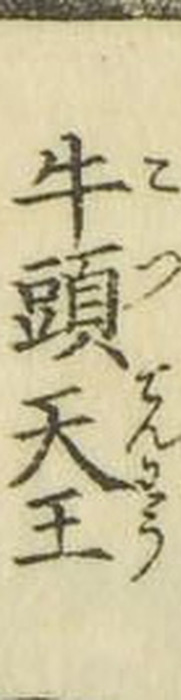牛頭天王
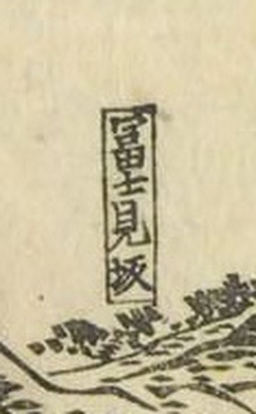冨士見坂
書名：江戸名所図会 20巻 巻之9
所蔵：東京学芸大学教育コンテンツアーカイブ
